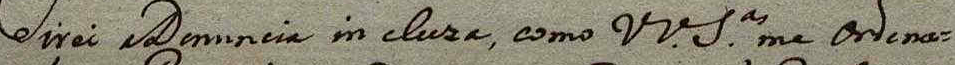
Tirei a Denuncia incluza, como V V. S.as me ordena
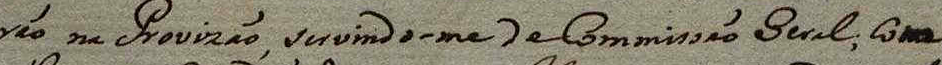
raõ na Provizaõ, servindo-me da Commissaõ Geral, Com
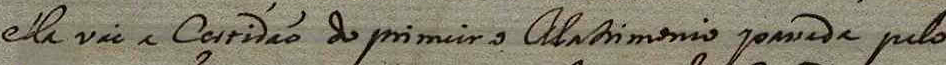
elle vai a Certidaõ do primeiro Matrimonio passada pelo
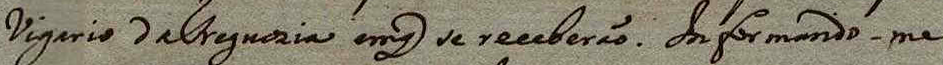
Vigario da Freguezia em q̄ se receberaõ. Informando-me
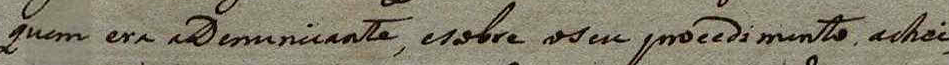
quem era a Denunciante, e sobre o seu procedimentto, achei
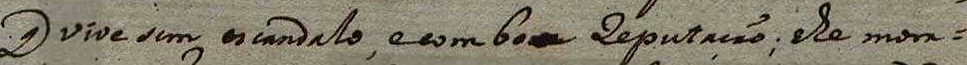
q̄ vive sem escandalo, e com bo_ Reputaçaõ, e he mora
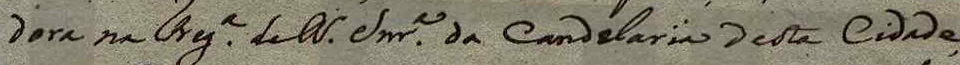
dora na Freg.a de N. Snr.a da Candelaria desta Cidade;
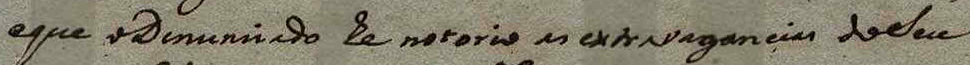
e que o Denunsiado he notorio as extravagançias do Seu
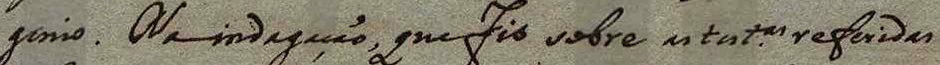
genio. Na indagaçaõ, que fis sobre as test.as referidas
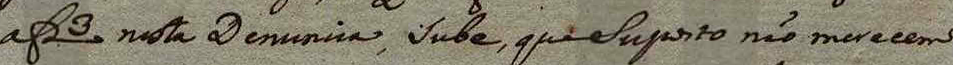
a f̄3 nesta Denuncia, sube, que Suposto naõ merecem
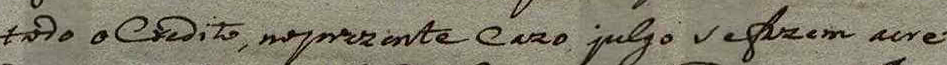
todo o Credito, no prezente cazo julgo se fazem acre
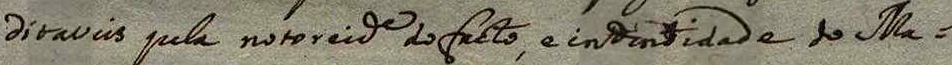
ditaveis pela notoreide do facto, e indentidade do Ma
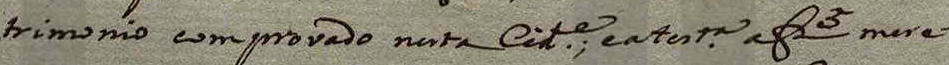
trimonio comprovado nesta Cid.e; e a test.a a f̄5 mere
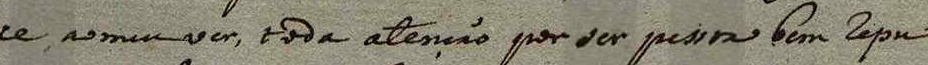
ce, ao meu ver, toda atençaõ por ser pessoa bem Repu
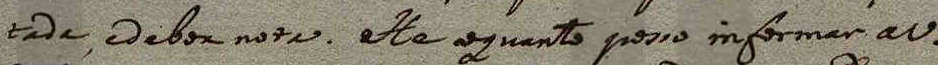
tada e de boa nota. He o quanto posso informar a V.
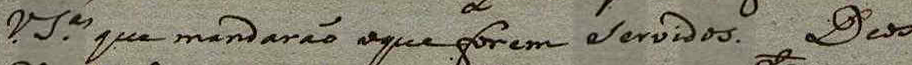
V. S.as que mandaraõ o que forem servidos. Deos
